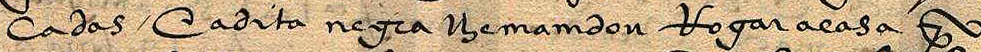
Cadas / e a dita negra lhe mamdou Rogar a casa p̄o
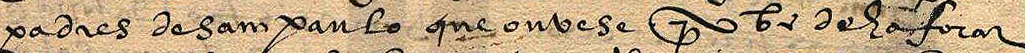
padres de sam paulo que ouvese p̄o bē de ha forar
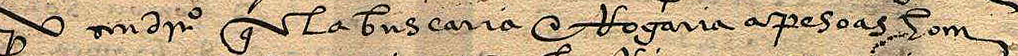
p̄o seu drro q̄ ela buscaria e Rogaria a pesoas hom
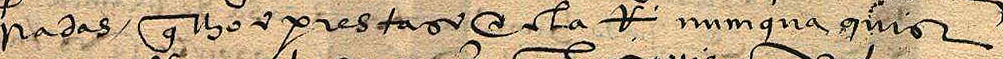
rradas / q̄ lho ēprestasē e ela R numqua quis
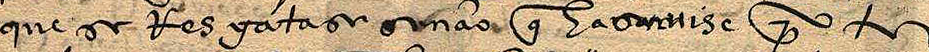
que se Resgatase senão q̄ ha seruise p̄o ter
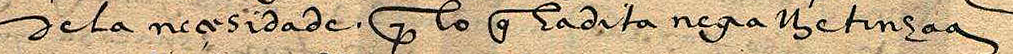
dela neçesidade. p̄lo q̄ ha dita negra lhe tinhaa
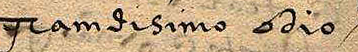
gramdisimo odio /
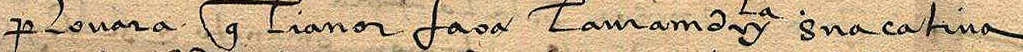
prouara q̄ Lianor Jaoa/ lauramdeyra sua catiua
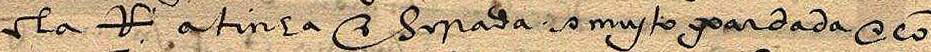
ela R a tinha ēSerrada e mujto goardada e cō
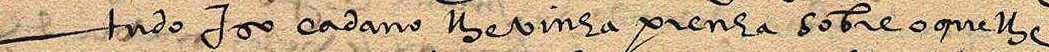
tudo Jso cadano lhe vinha prenha sobre o que lhe
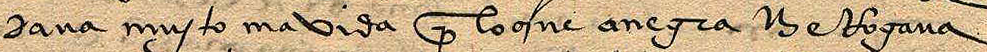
daua mujto ma vida p̄lo que a negra lhe Rogaua
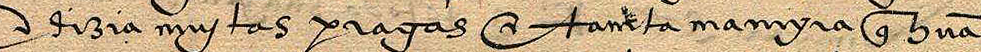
e dizia mujtas pragas ē tamta maneyra q̄ huā
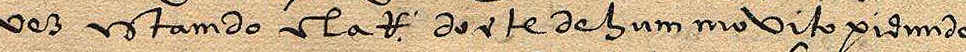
vez estamdo ela R doēte de hum movito pidimdo
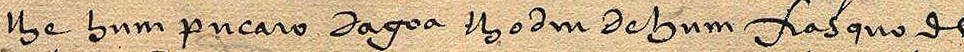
lhe hum pucaro dagoa lho deu de hum frasquo de
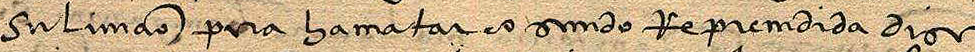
Sulimaõ pera ha matar e semdo Repremdida dise
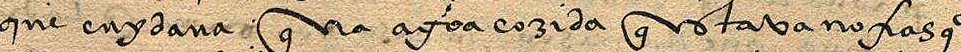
que cuydaua q̄ era agoa cozida q̄ estava no frasqo
